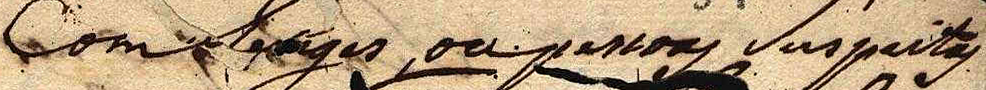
Com hereges, ou pessoas Suspeitas
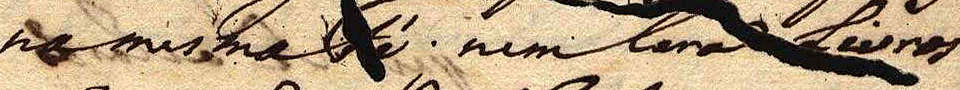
na mesma Fé; nem Lera Livros
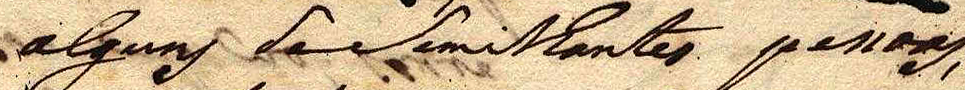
alguns de Semilhantes pessoas,
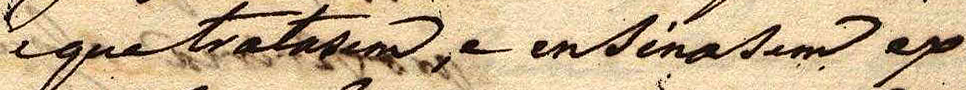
e que tratasem, e ensinasem ex
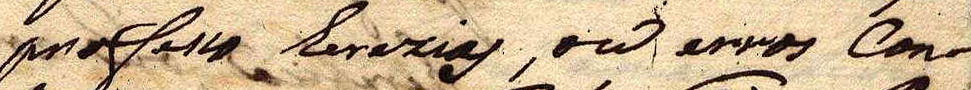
professo herezias, ou erros con
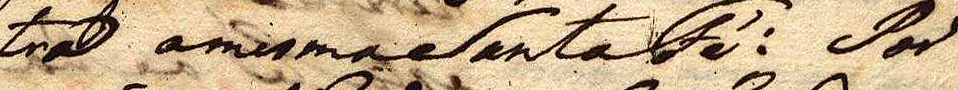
tra a mesma Santa Fé: por
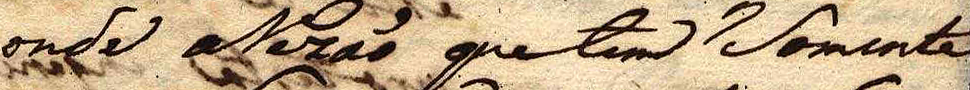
onde a Rezaõ que tem? Somente
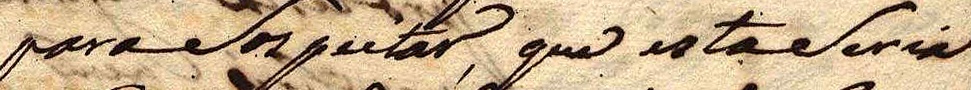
para Sospeitar, que esta seria
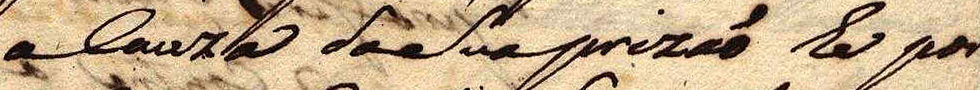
a Cauza da sua prizaõ he por
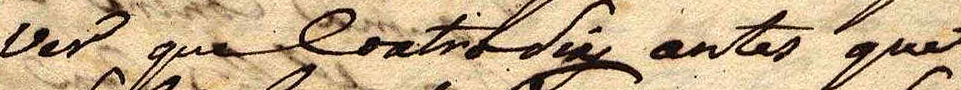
ver que Coatro dias antes que
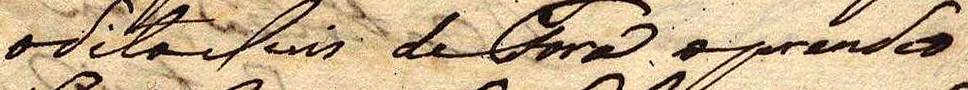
o dito Iuis de Fora o prendeo
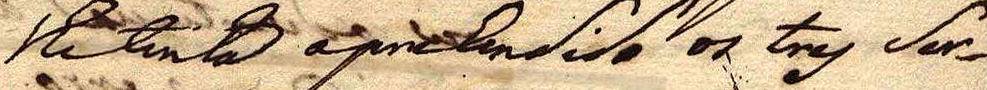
lhe tinha aprehendido os tres Ser
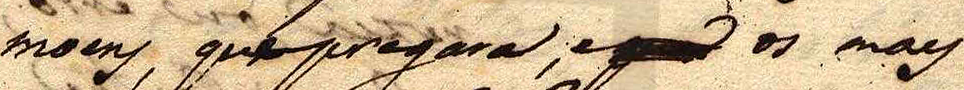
moens, que pregara, e ___ os maes
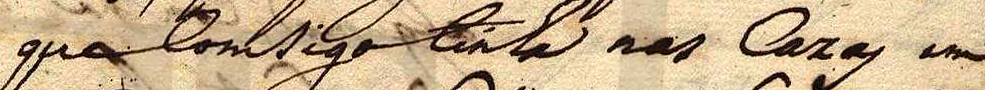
que Comsigo tinha nas Cazas em
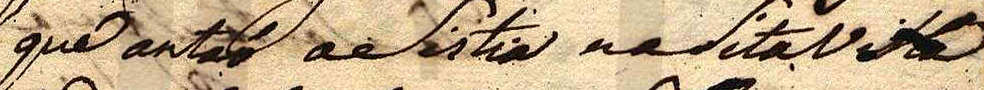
que antaõ aSistia na dita Villa
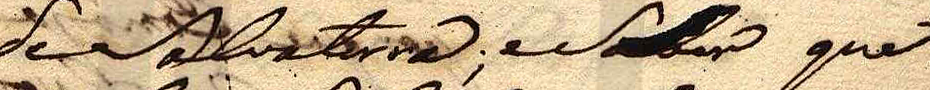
de Salvaterra; e S__er que
